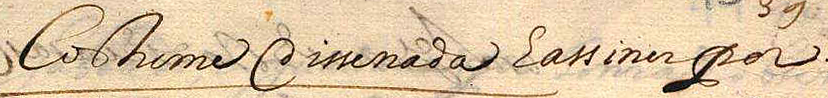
Costume disse nada E assinei por
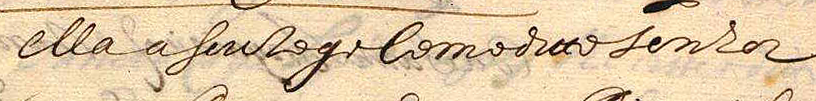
ella a seu Rogo com o ditto senhor
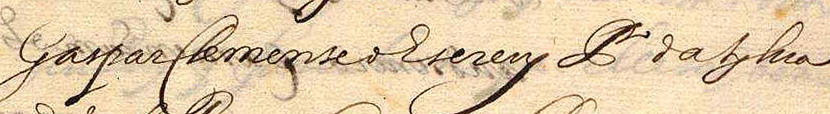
Gaspar Clemente o Escreuj Po da sylua
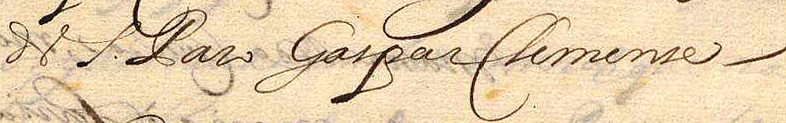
de S. Paio Gaspar Clemente -
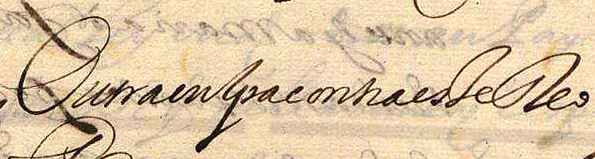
Outra culpa contra este Reo
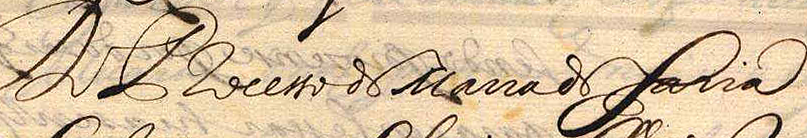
Do PRocesso de Maria de faria
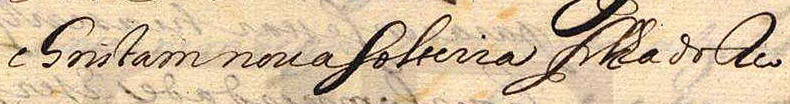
christam noua solteira filha do Reo
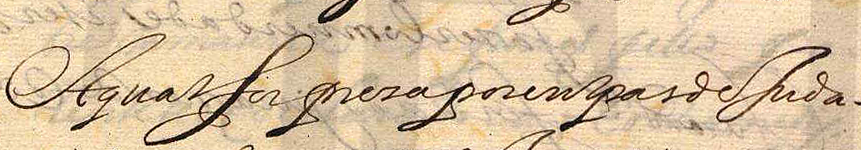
A qual foi preza por culpas de Juda
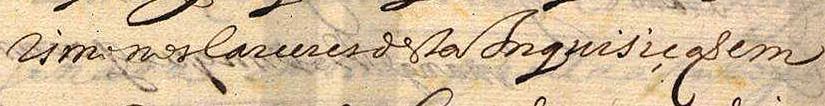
ismo nos carceres desta Inquisiçaõ em
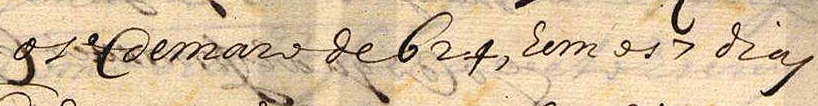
o 1o de maio de 624, E em os 7 dias
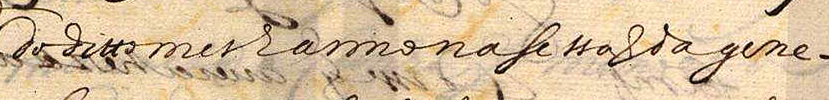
do ditto mes E anno na sessaõ da gene
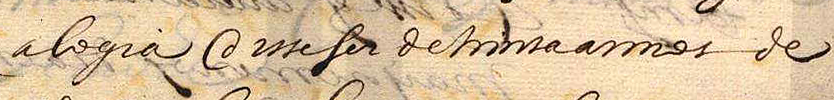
alogia disse ser de trinta annos de
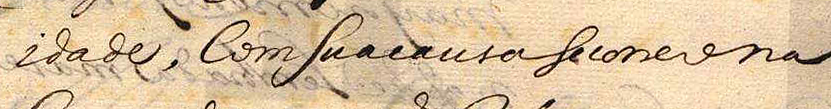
idade, Com sua causa se correr e na
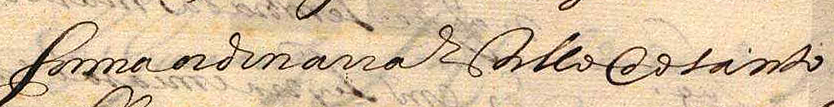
forma ordinaria E stillo do santo
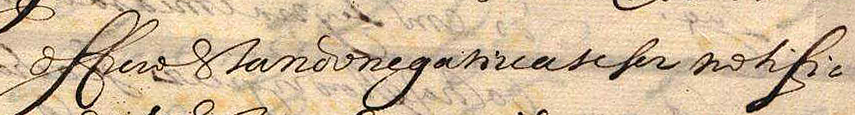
officio estando negatiua te ser notific
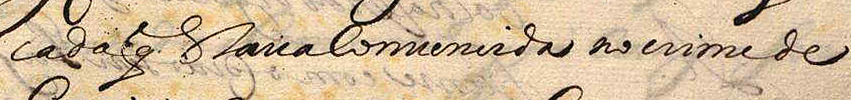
cada q̄ estaua conuencida no crime de
